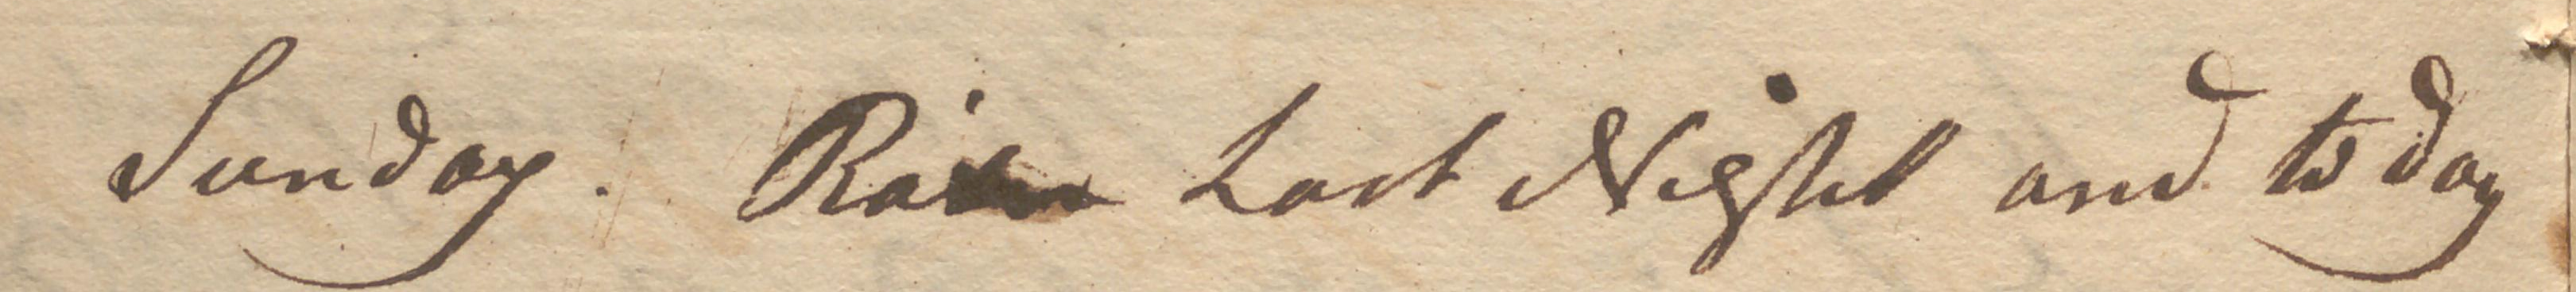Sunday. Racer Last Night and to day
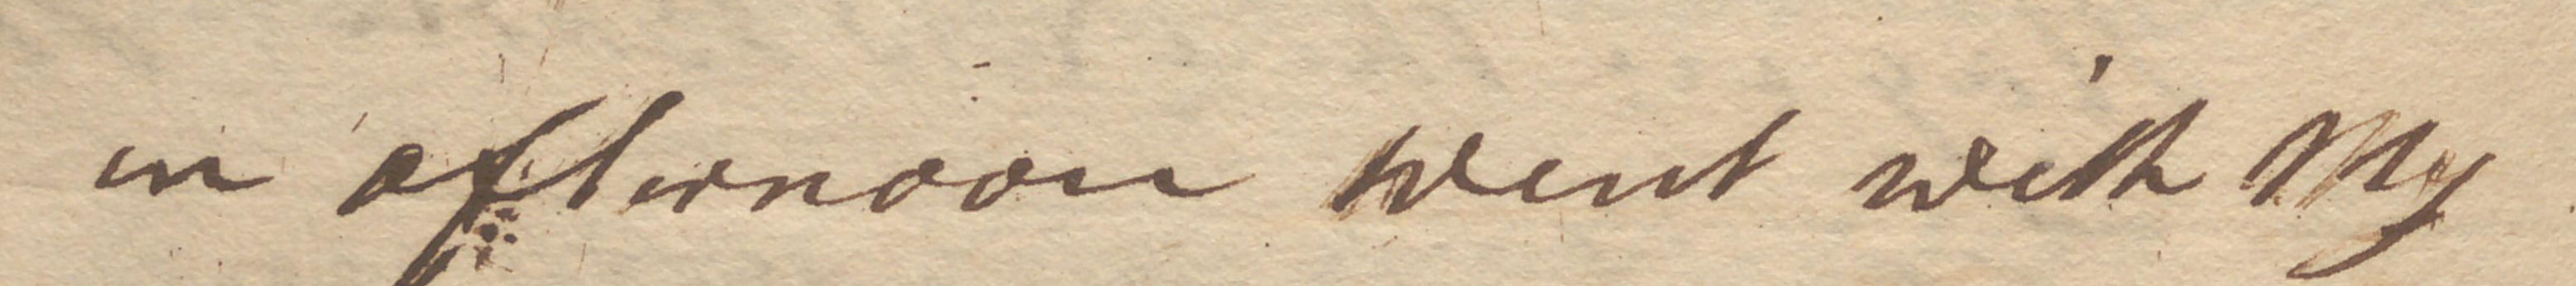in afternoon went with My
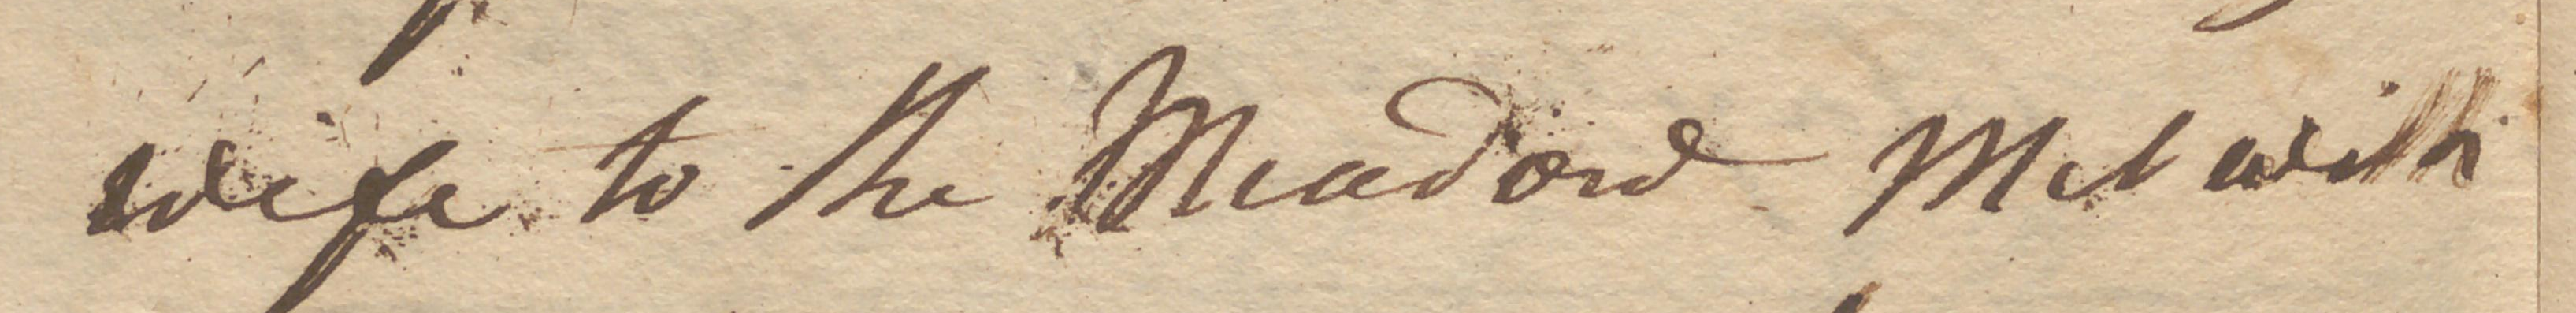wife to the Meadow Mel with
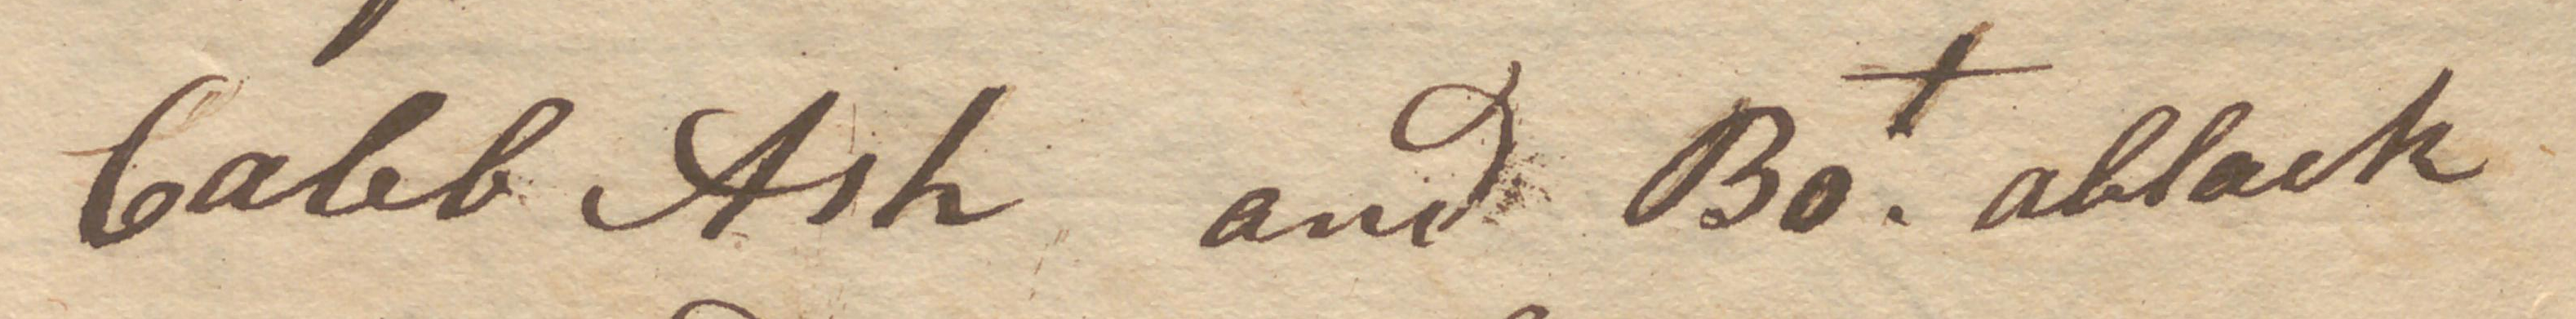Caleb Ash, and Bo^t. ablack
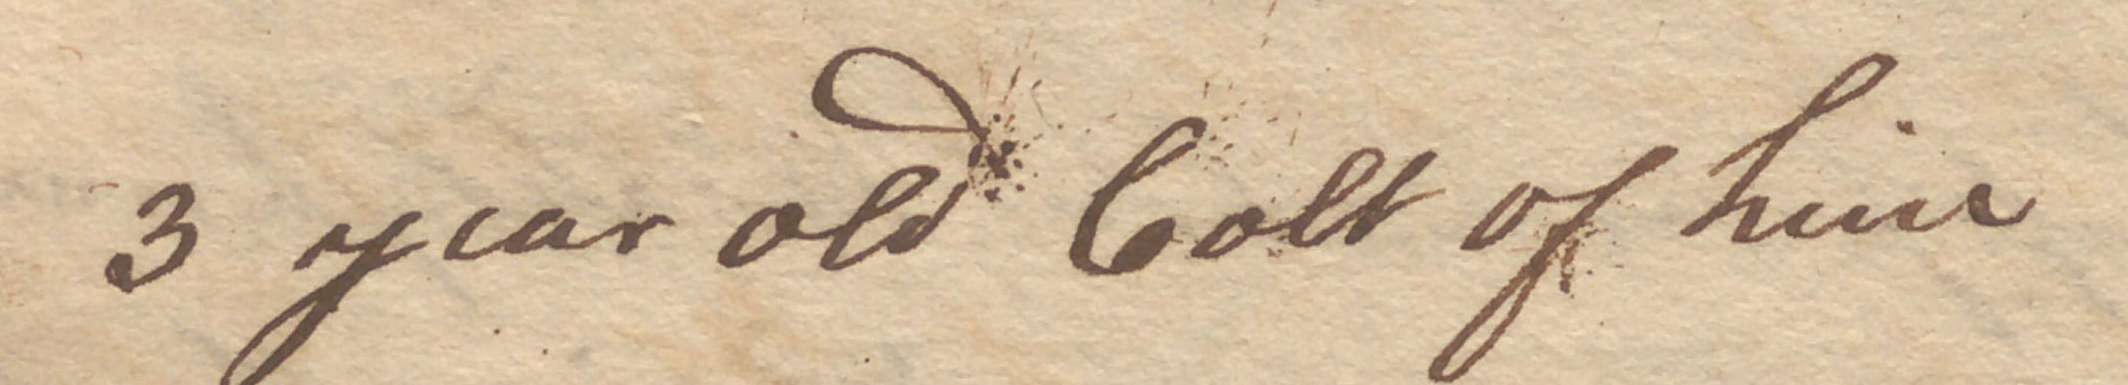3 year old Colt of hime
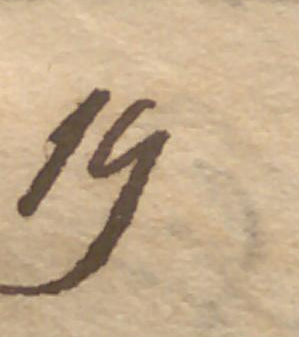9
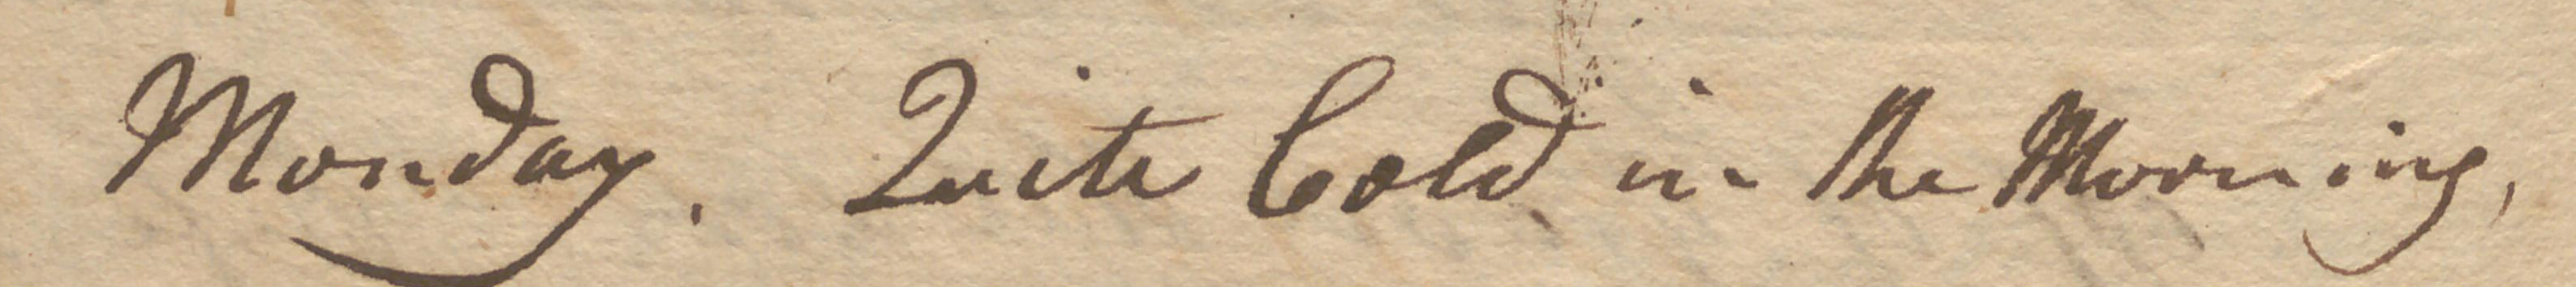Monday Quite Cold in the Morning
